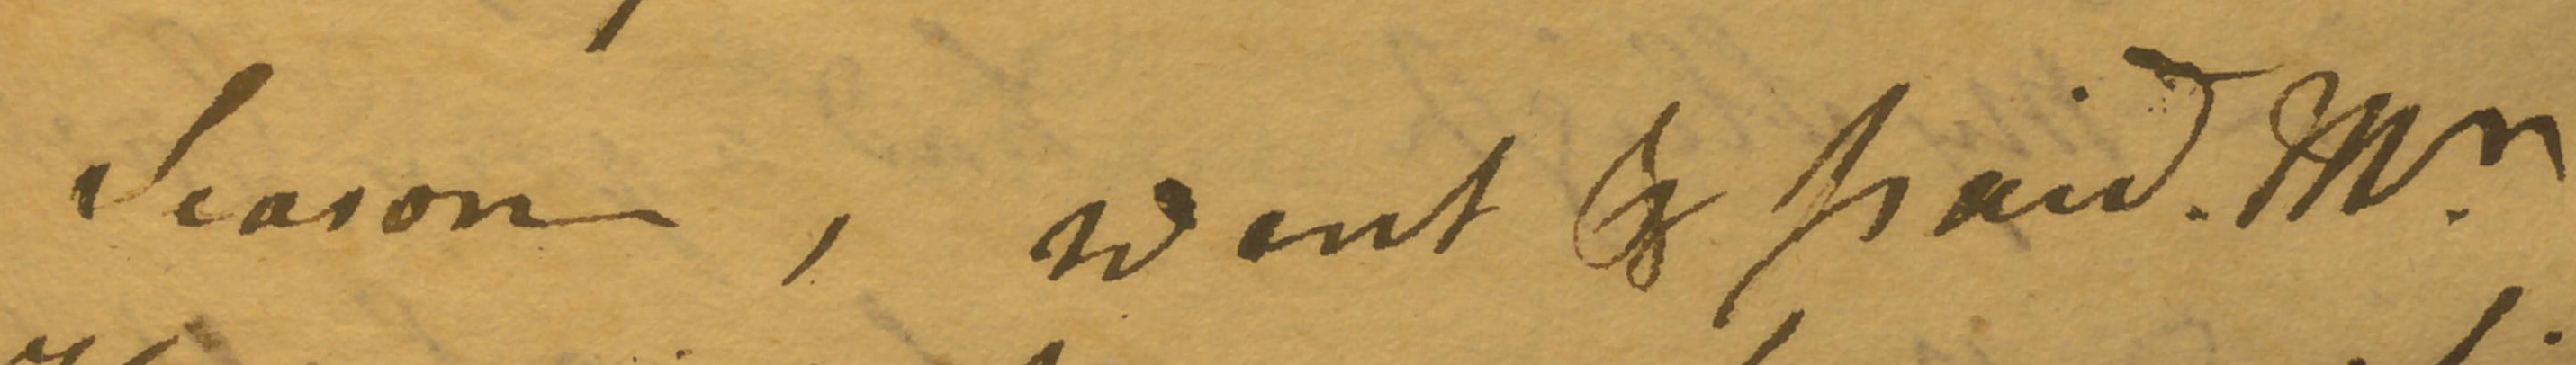Season, went & paid M^r.
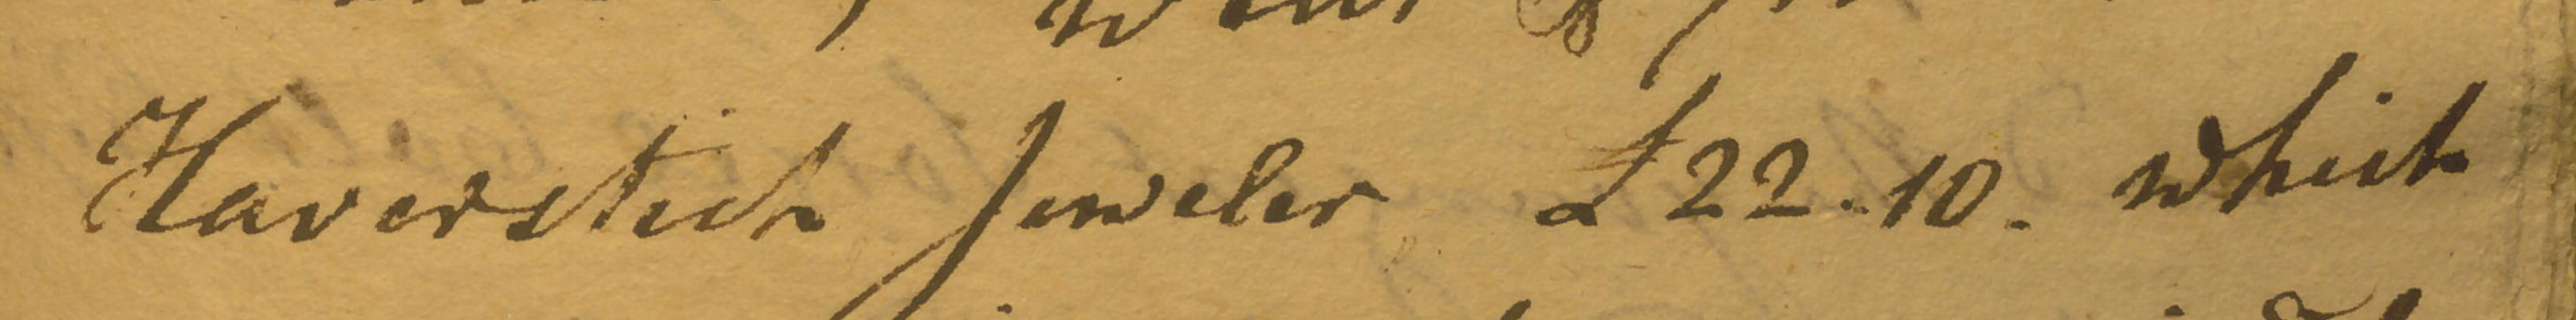Haverstich Jeweler £22.10. which
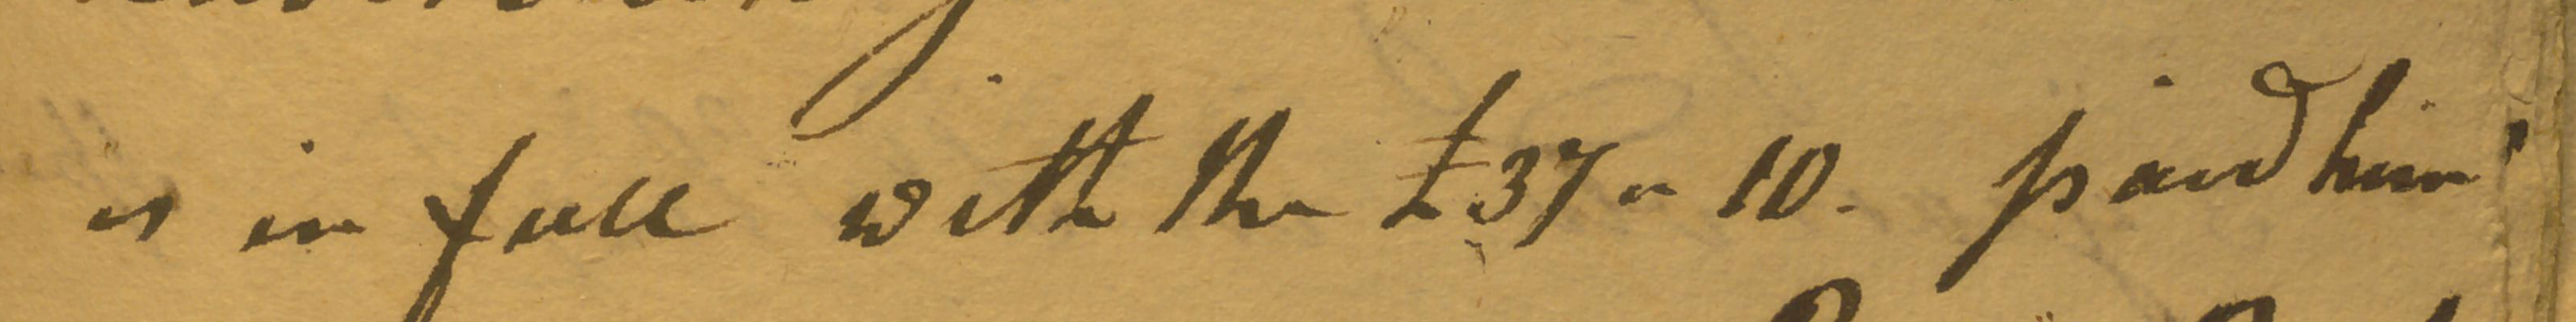is in full with the £37..10. paid him
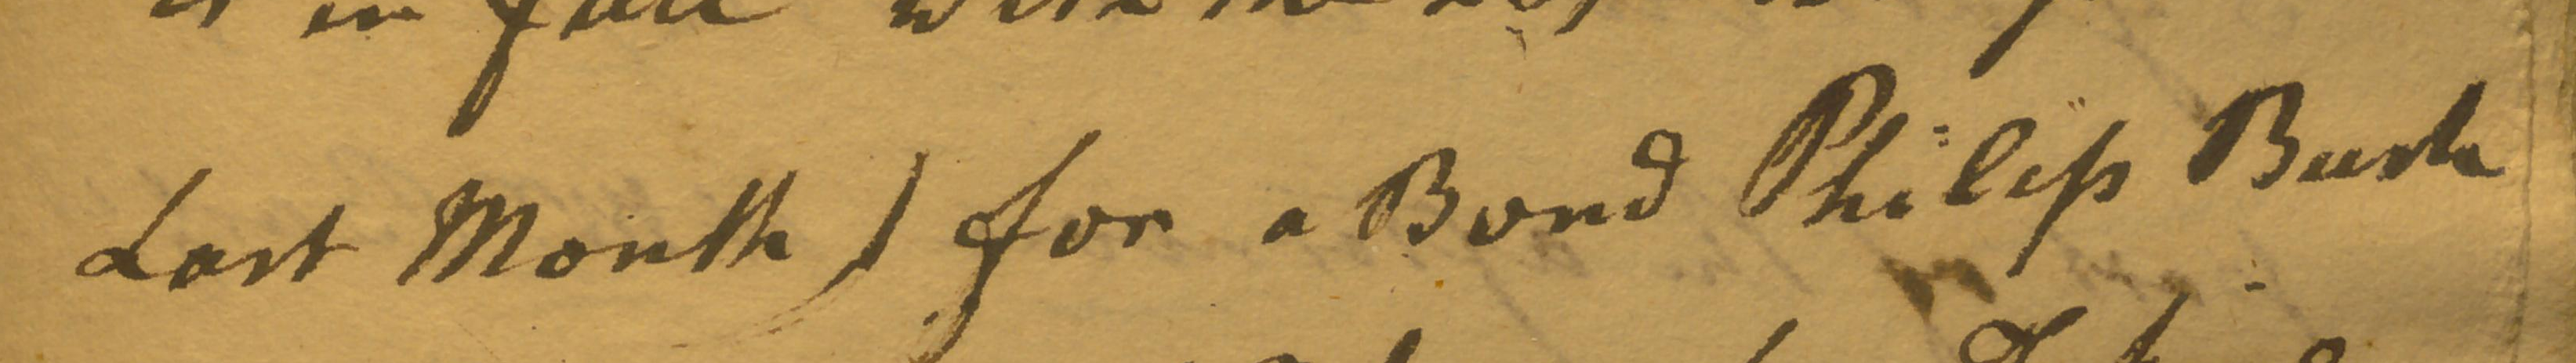Last Month ) for a Bond Philip Bush
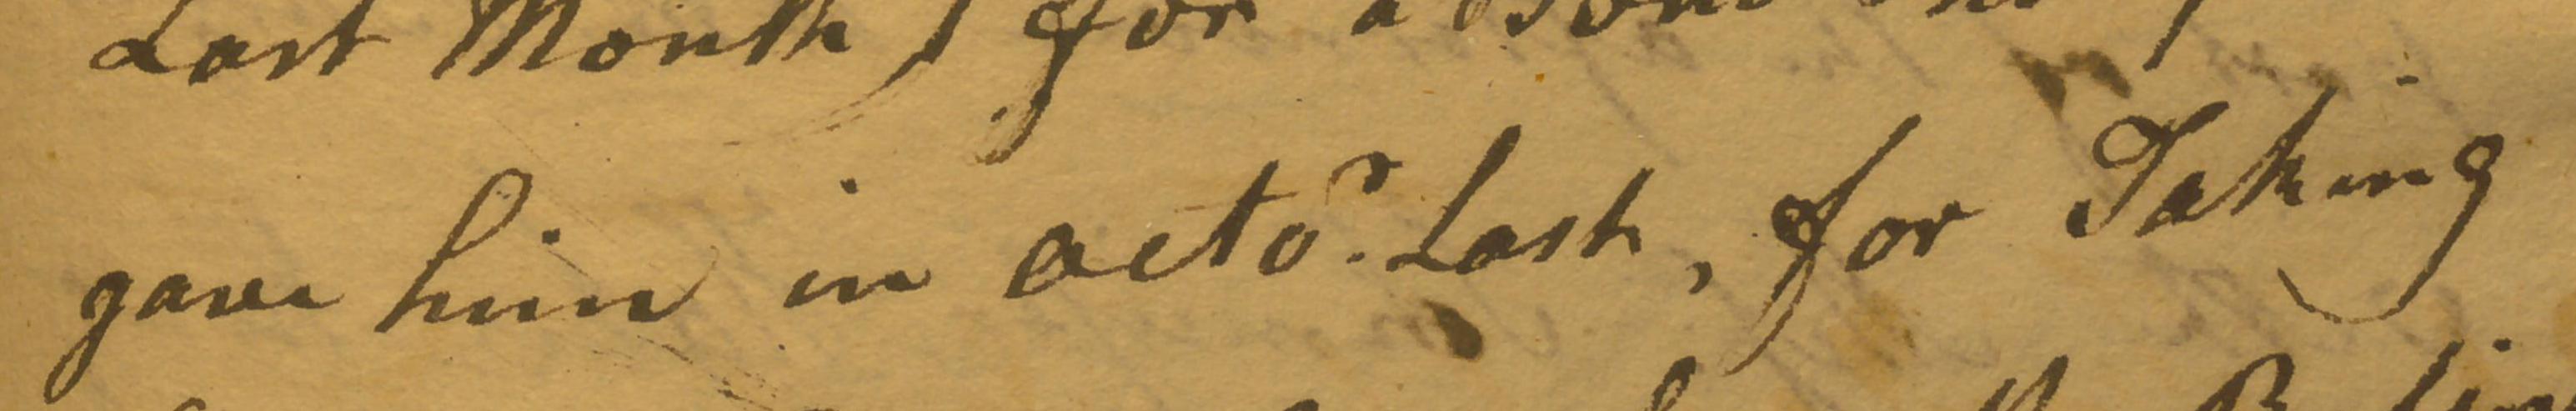gave him in octo^r. Last, for Taking
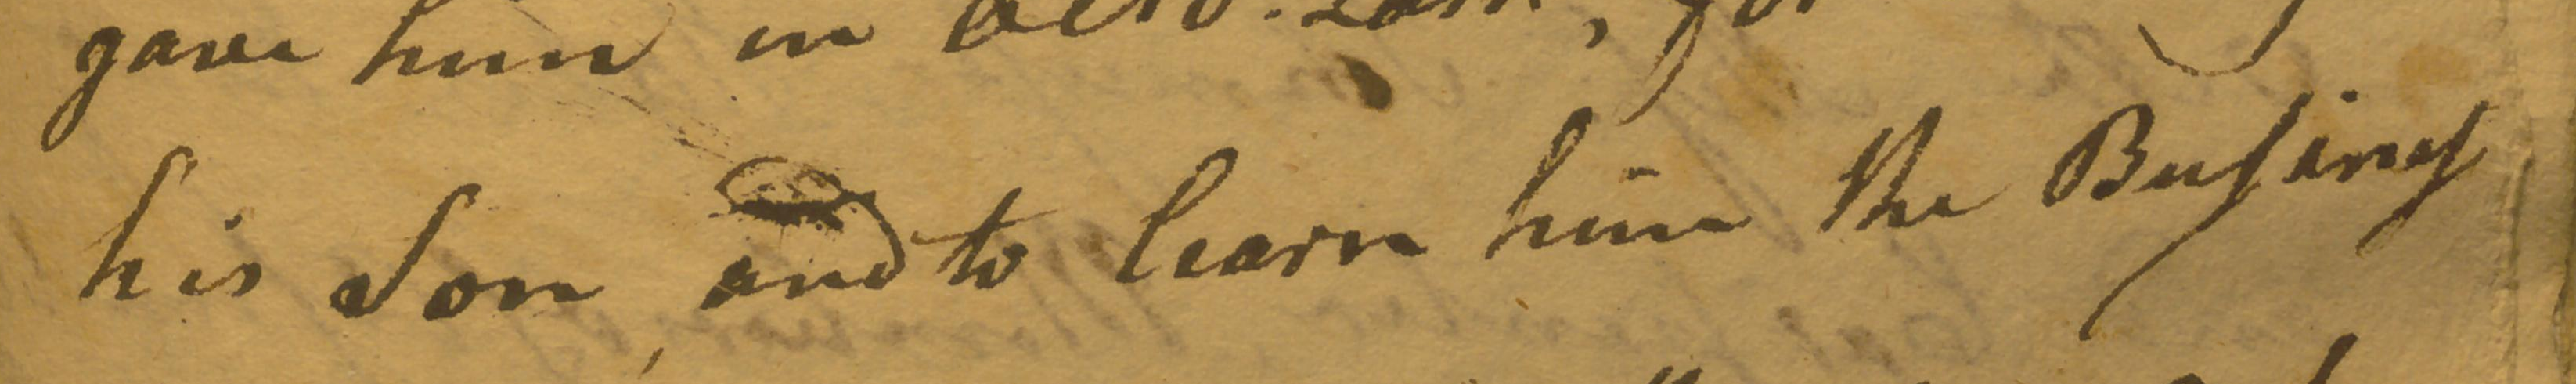his Son and to learn him the Busines
